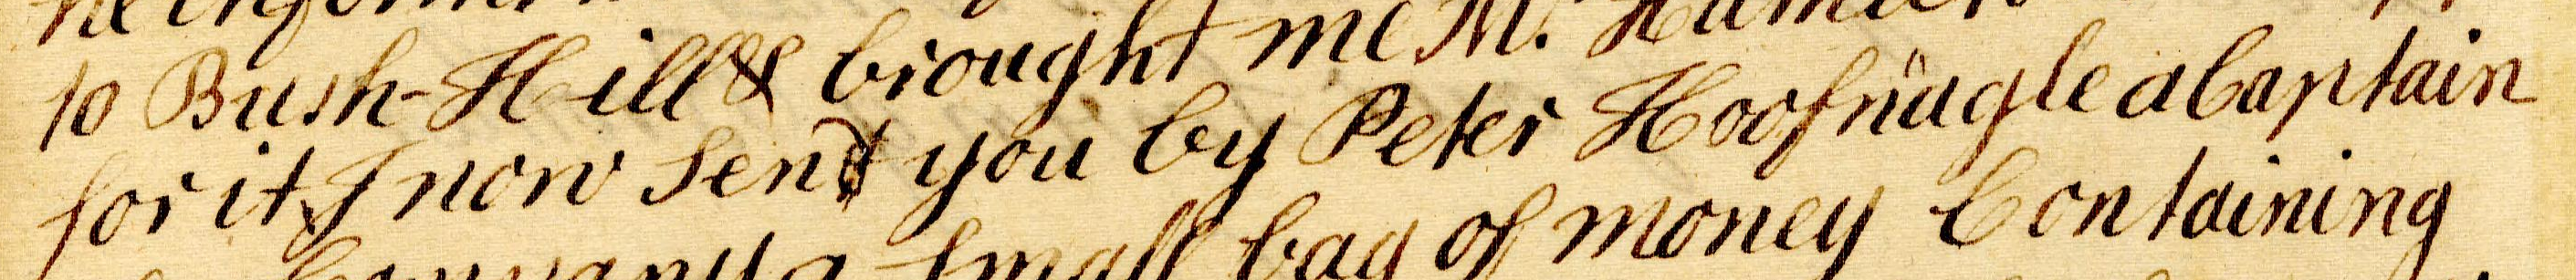for it I now send you by Peter Hoofnagle a Captain
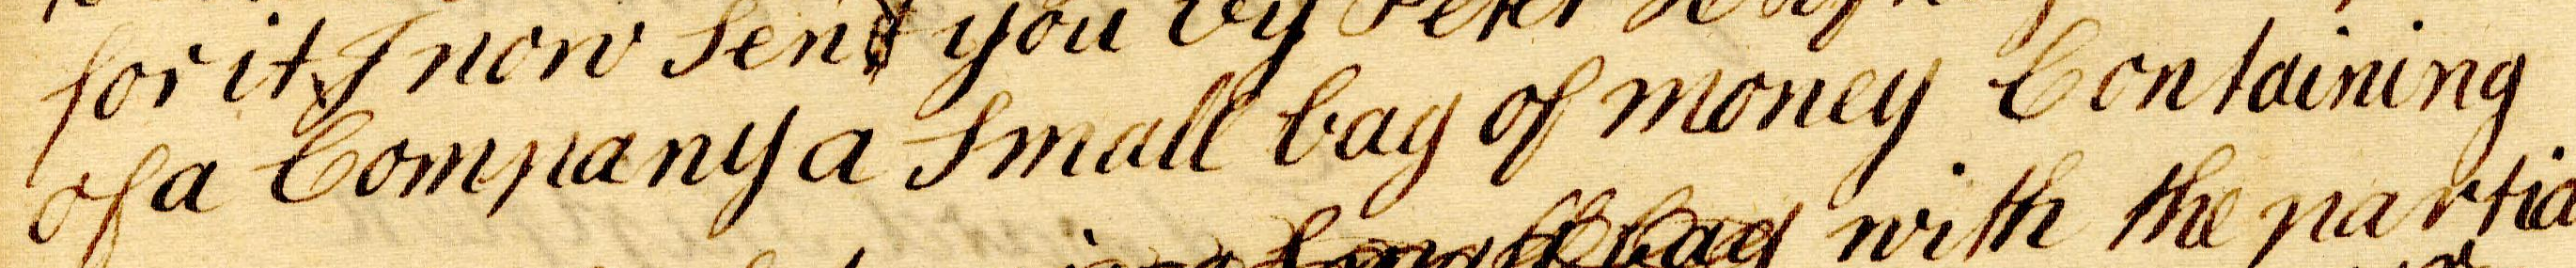of a Company a Small bay of Money Containing
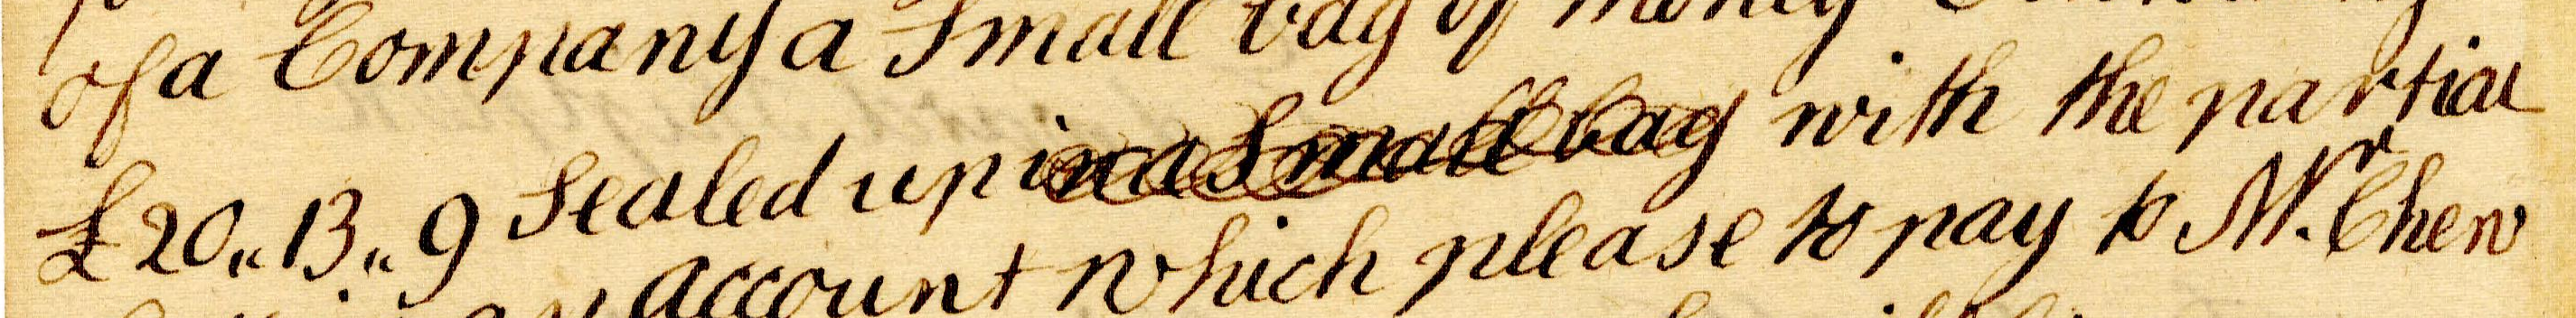£20..13..9 Sealed up [in a Small bag] with the partial
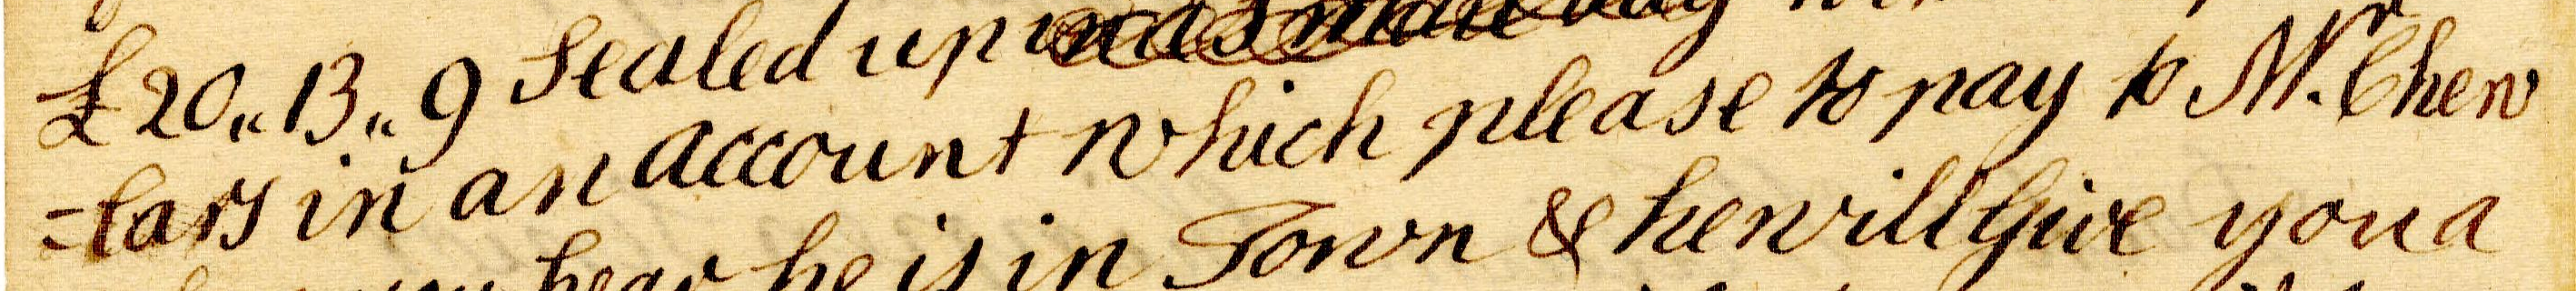-lars in an Account which please to pay to M^r. Chew
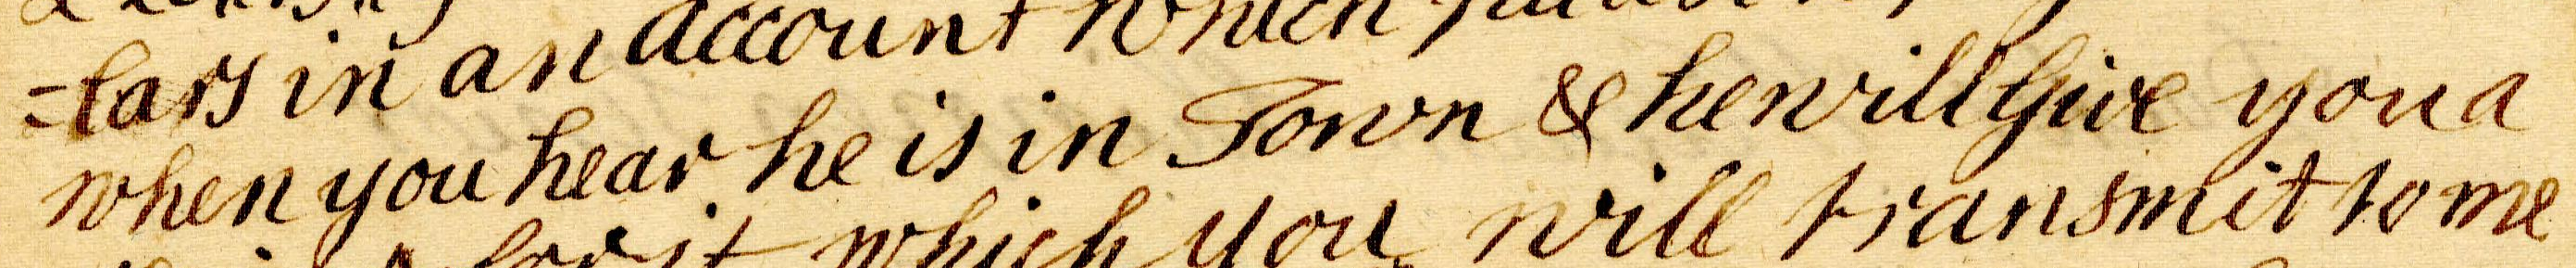when you hear he is in Town & he will give you a
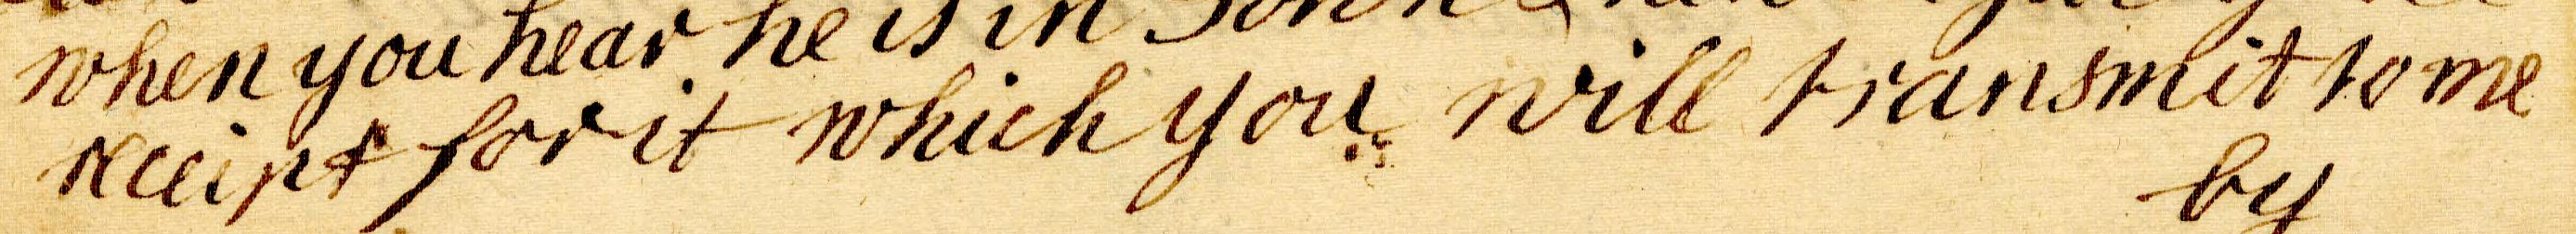receipt for it which you will transmit to me
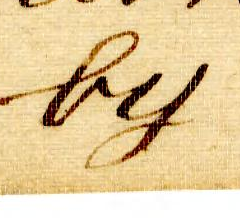by
